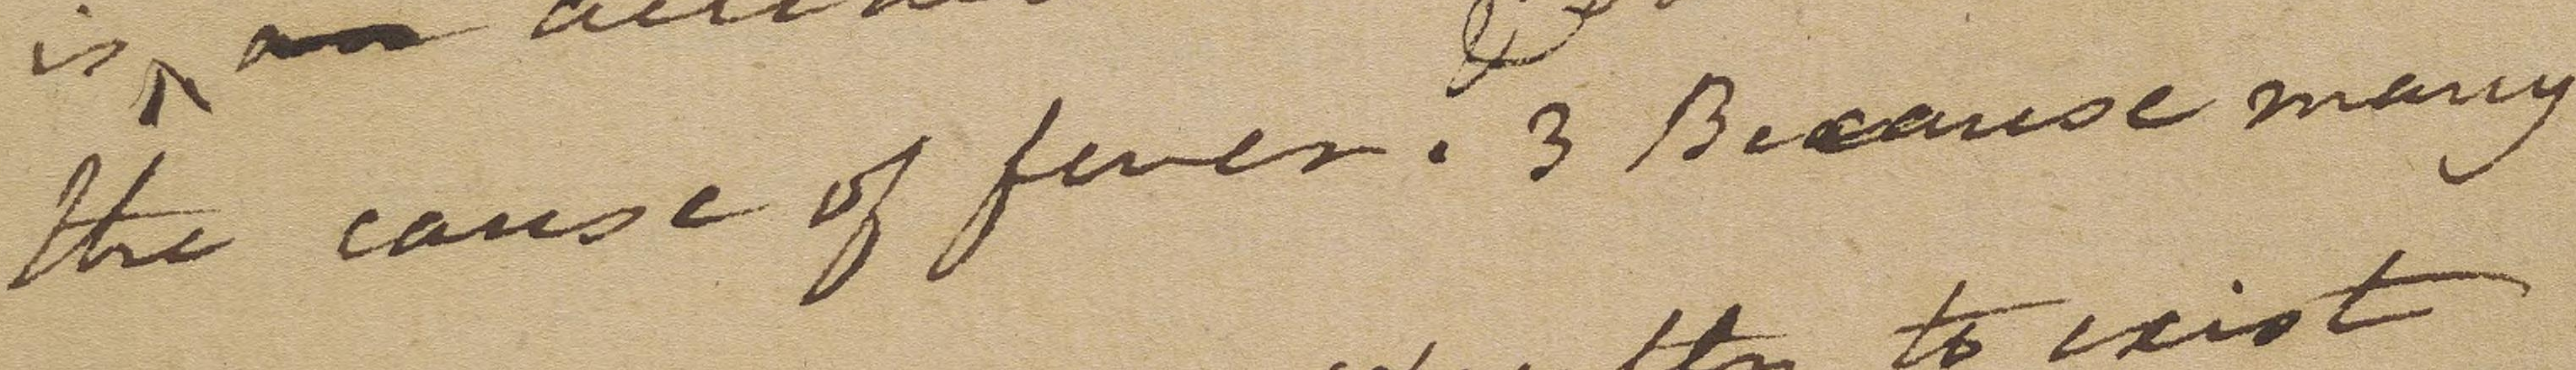the cause of fever. 3 Because many
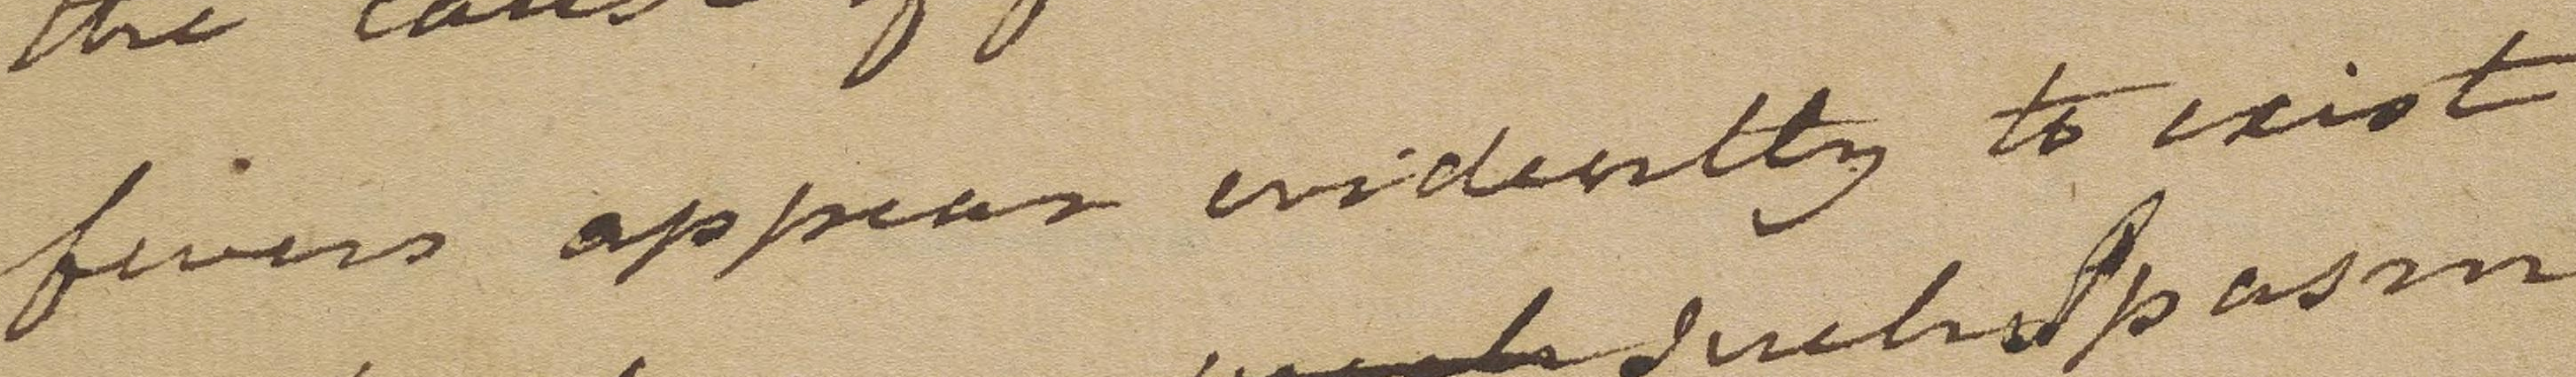fevers appear evidently to exist
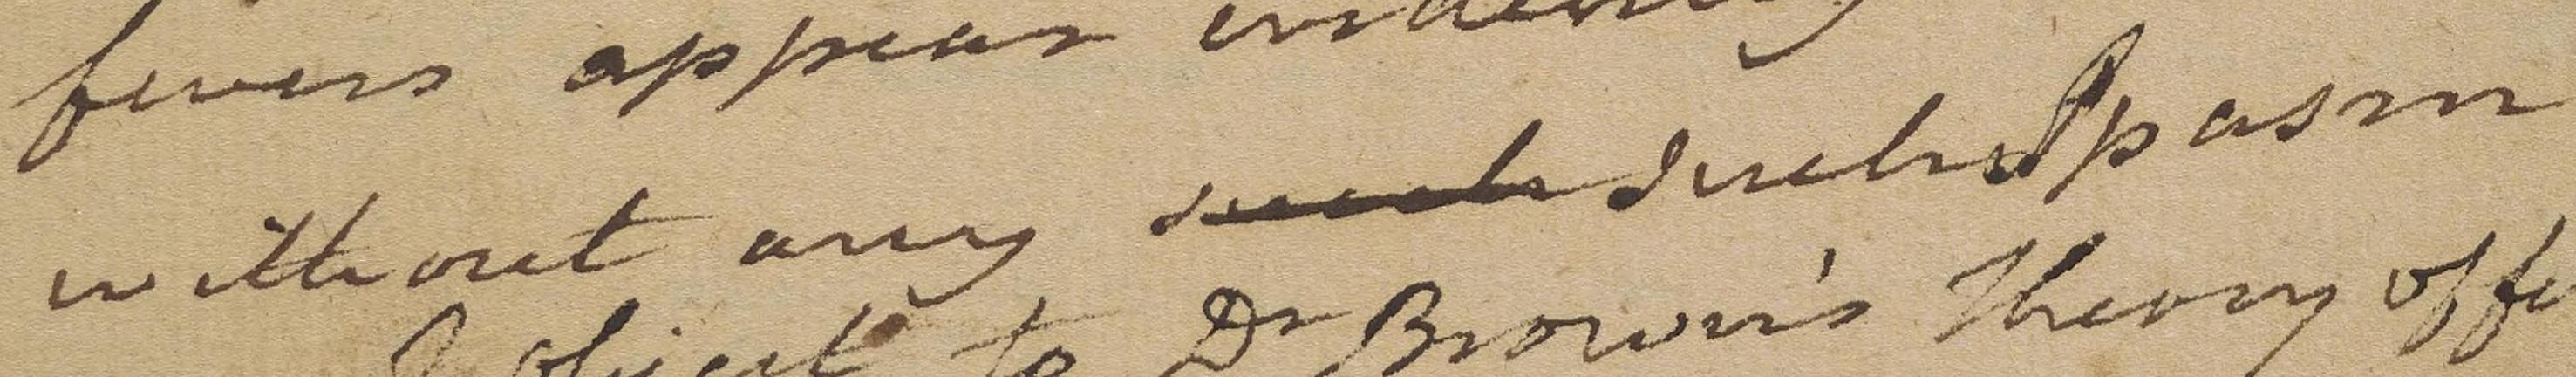without any such spasm
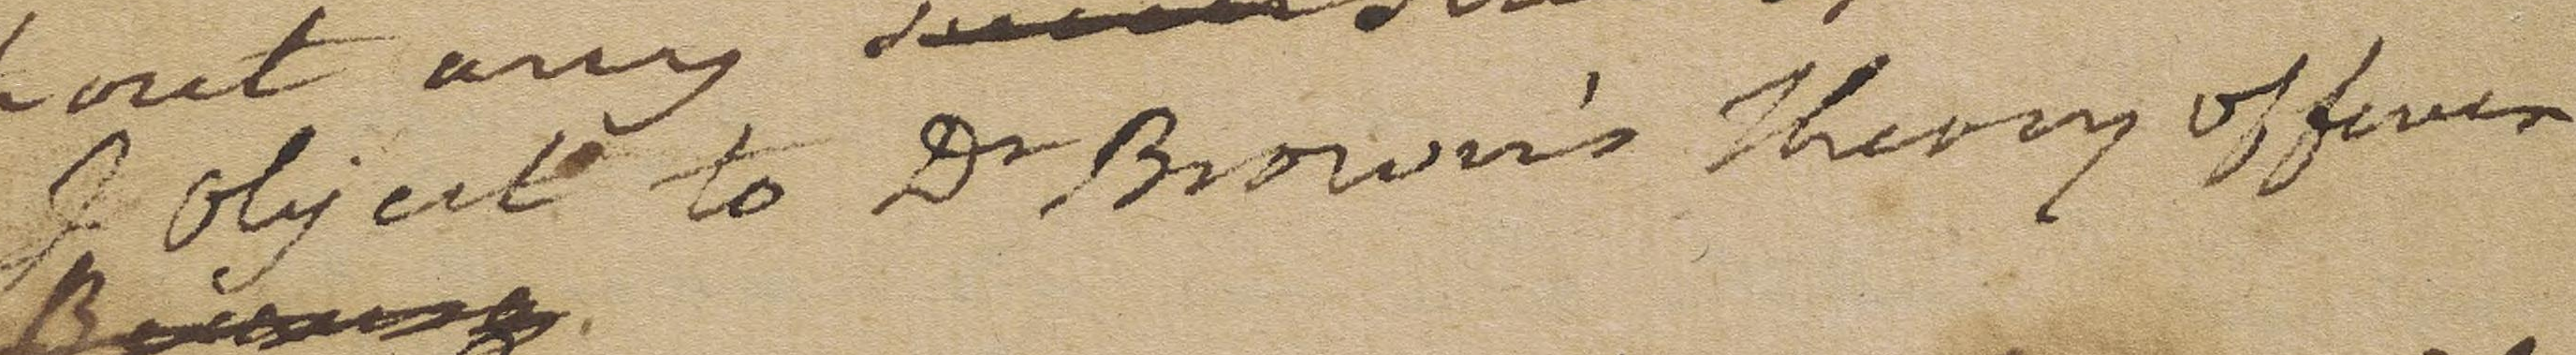I object to D^r Brown's theory of fever
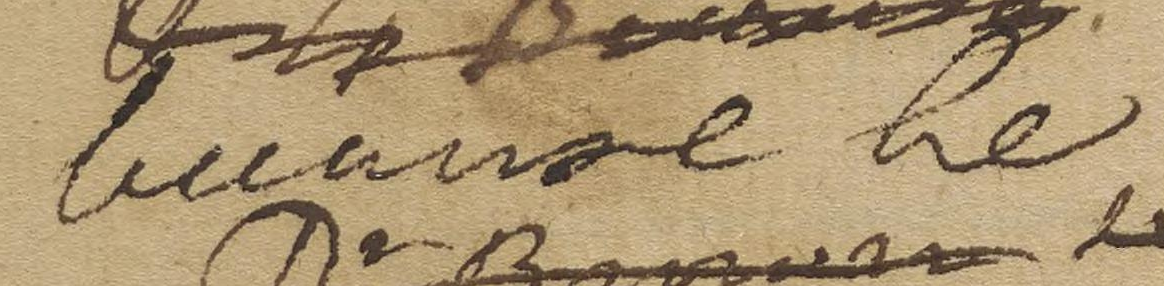because he
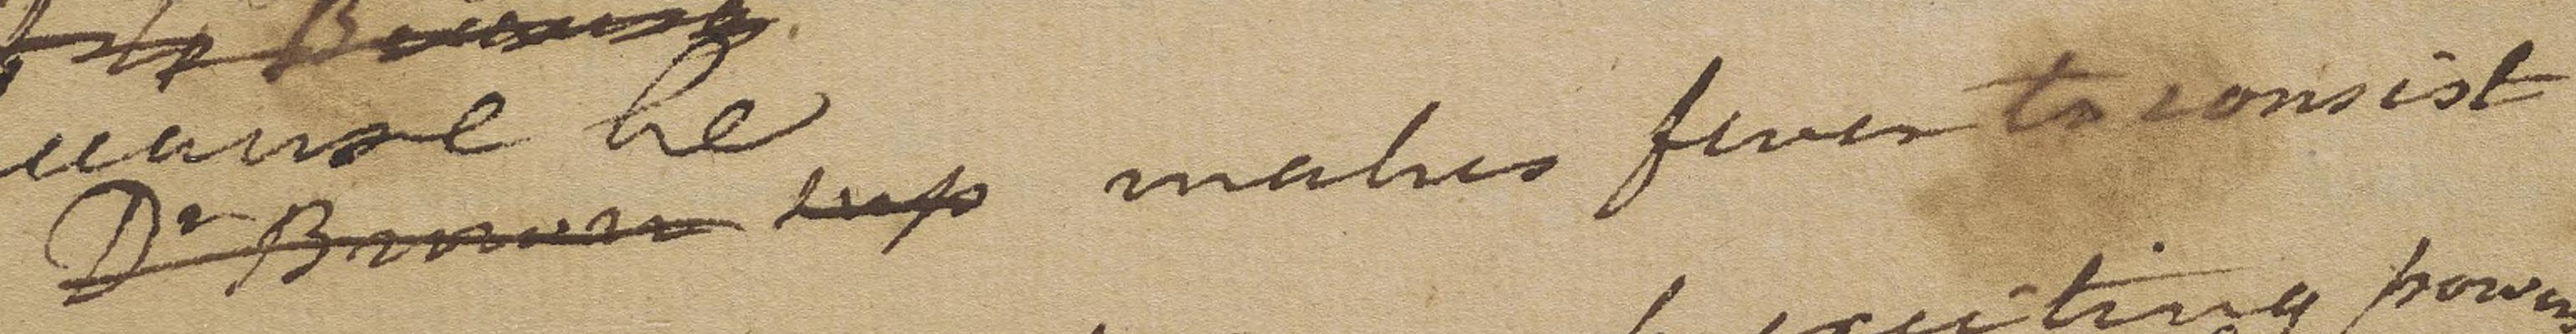[D^r Brown ____] because he makes fever to consist
